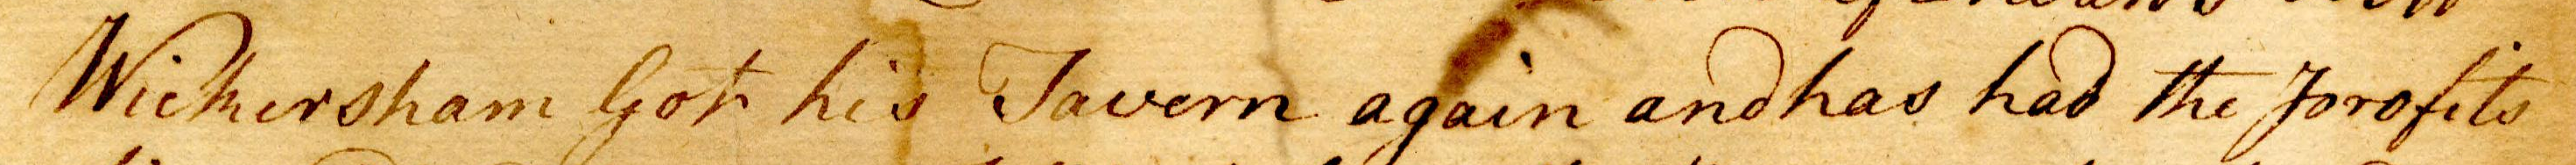Wickersham Got his Tavern again and has had the profits
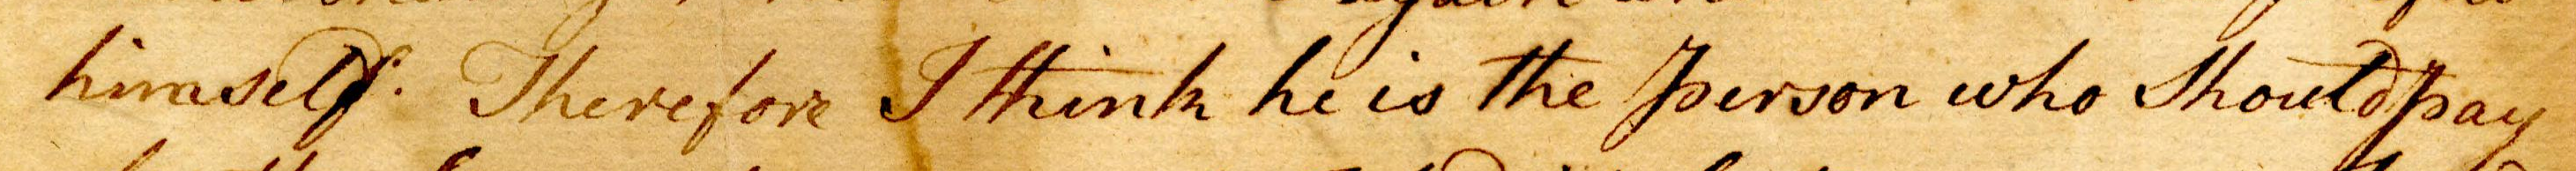himself: Therefore I think he is the person who should pay
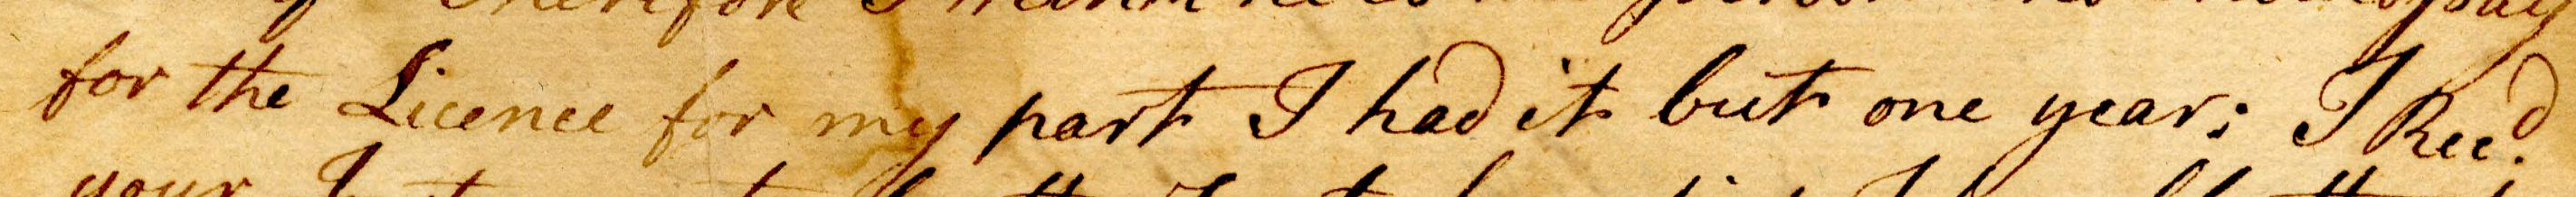for the Licence for my part I had it but one year; I Rec^d.
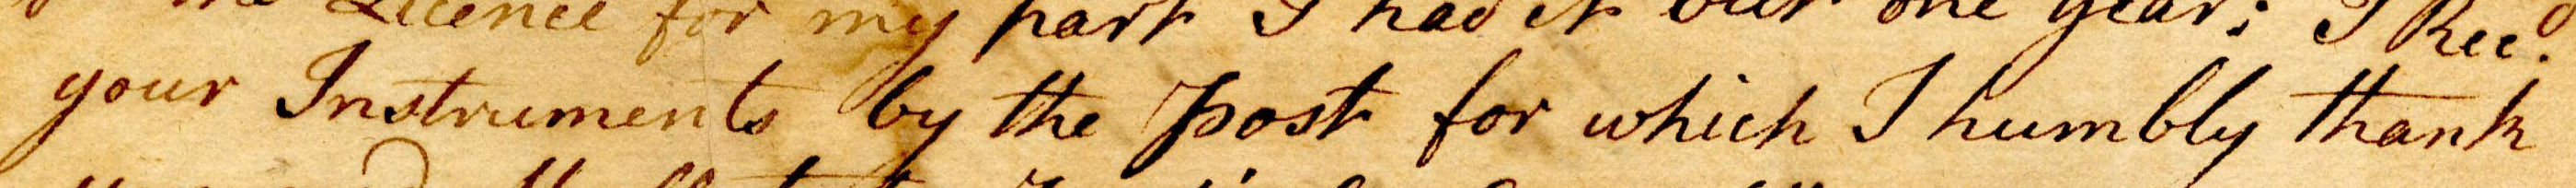your Instruments by the post for which I humbly thank
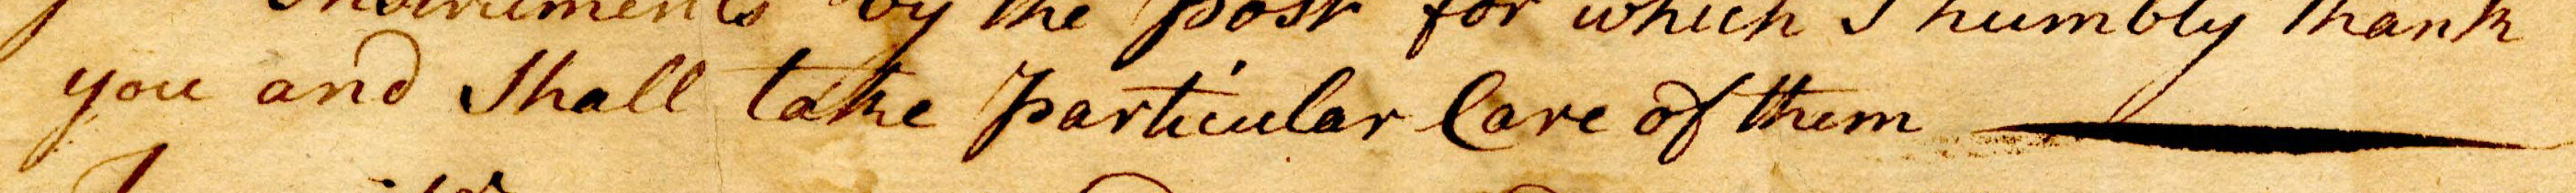you and shall take particular Care of them-
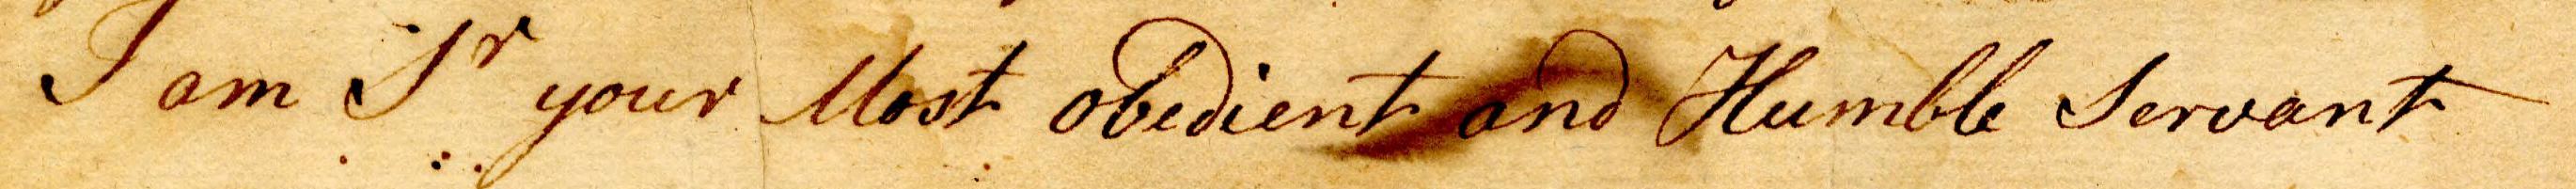I am S^r: your Most obedient and Humble Servant
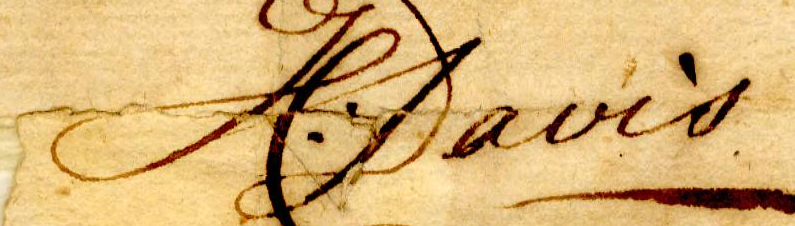H: Davis
